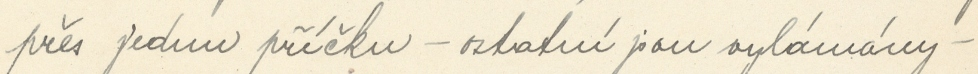přes jednu příčku - ostatní jsou vylámány -
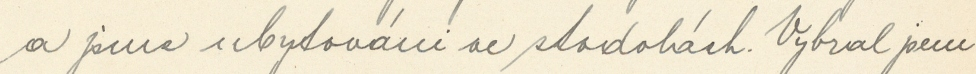a jsme ubytováni ve stodolách. Vybral jsem
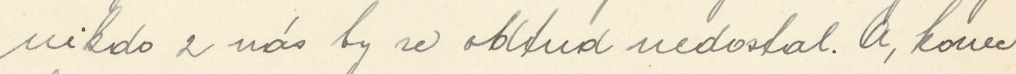nikdo z nás by se odtud nedostal. A, konec
